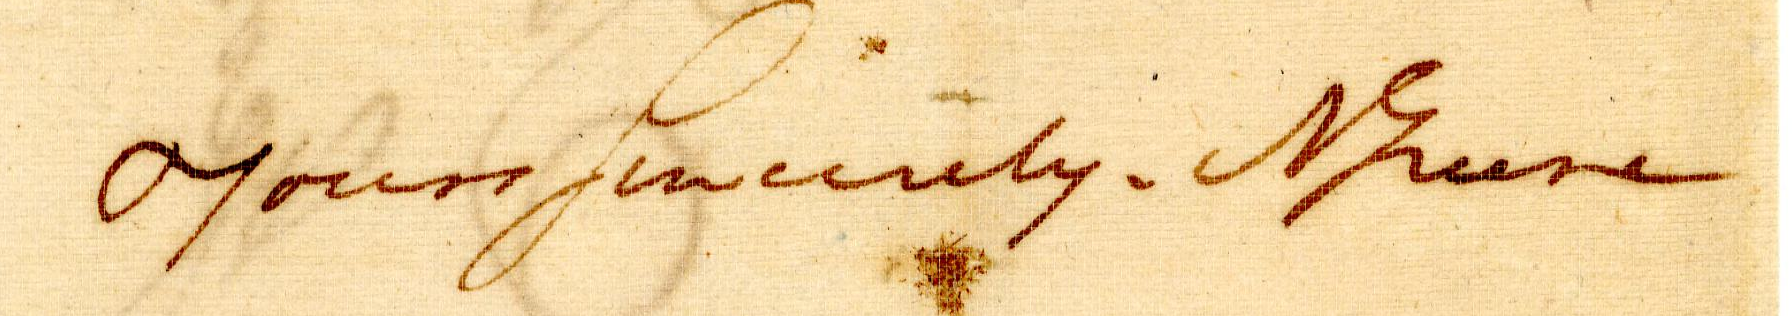Yours Sincerely. N Greene
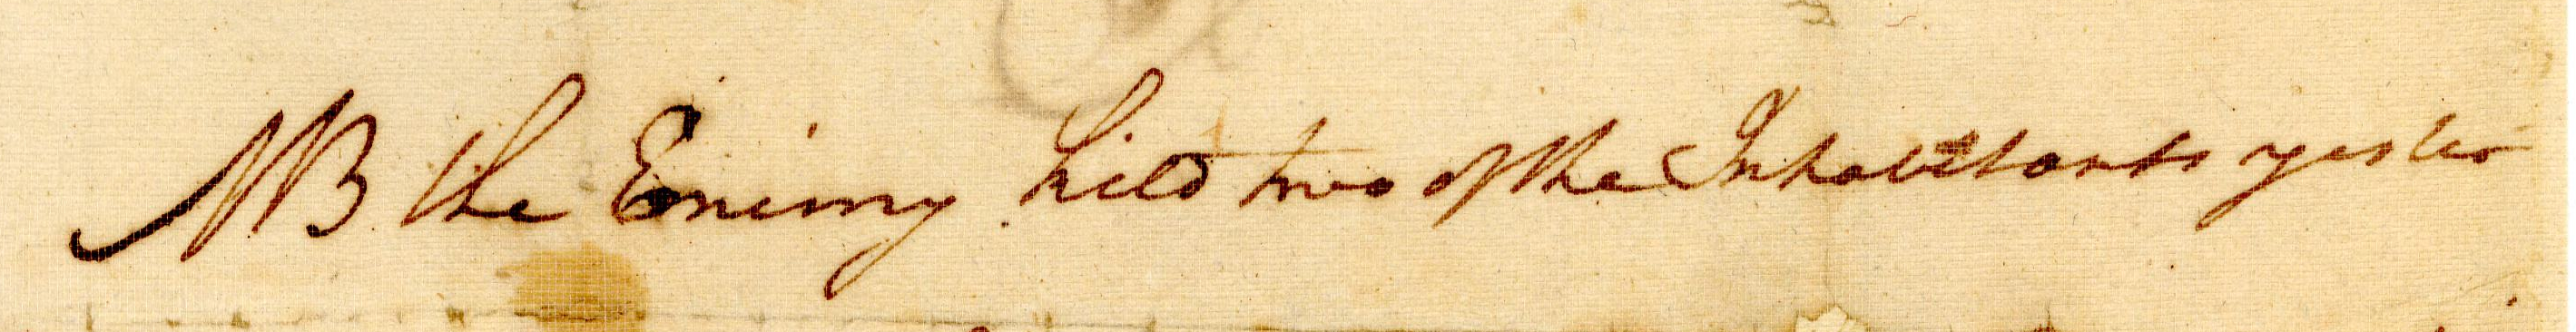NB The Enemy kild two of the Inhabitants yester
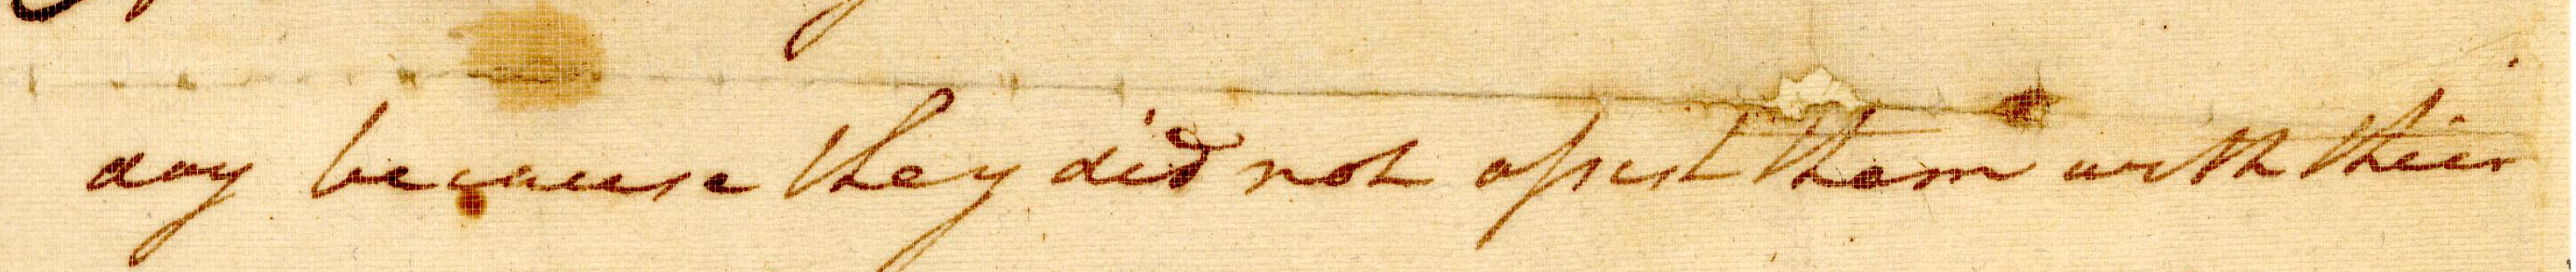day beause they did not assist them with their
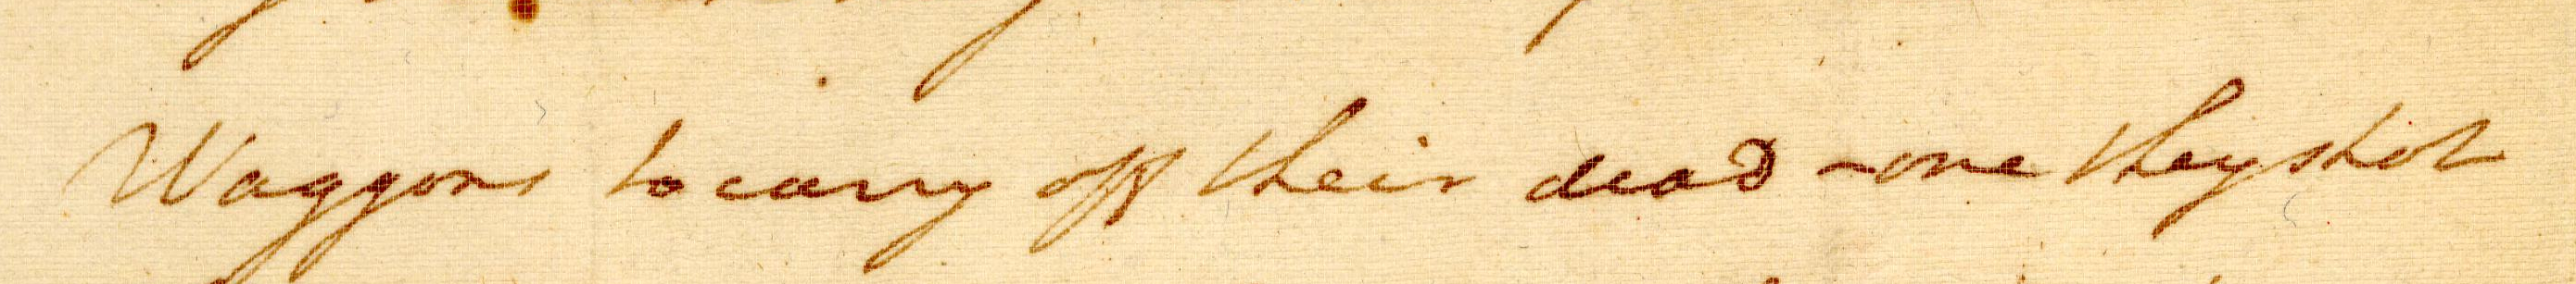Waggons to carry off their dead- one they shot
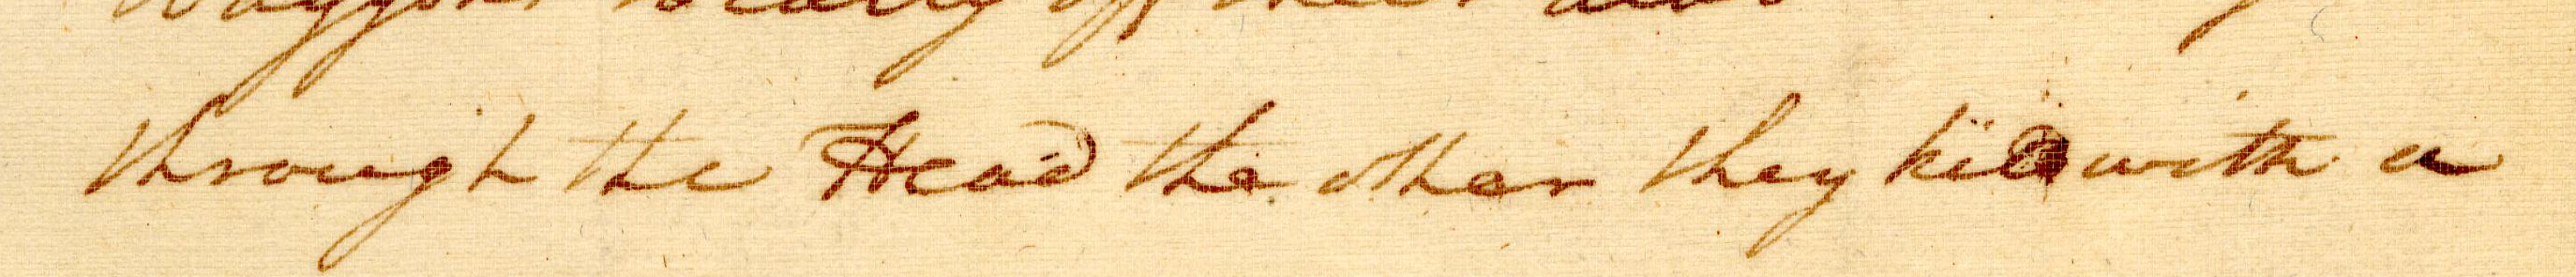through the Head the other they kild with a
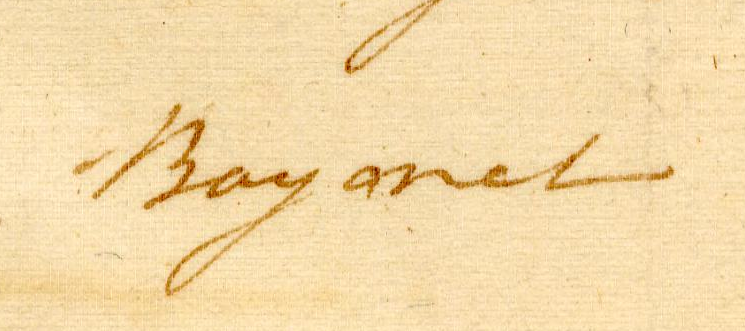Bayanet
